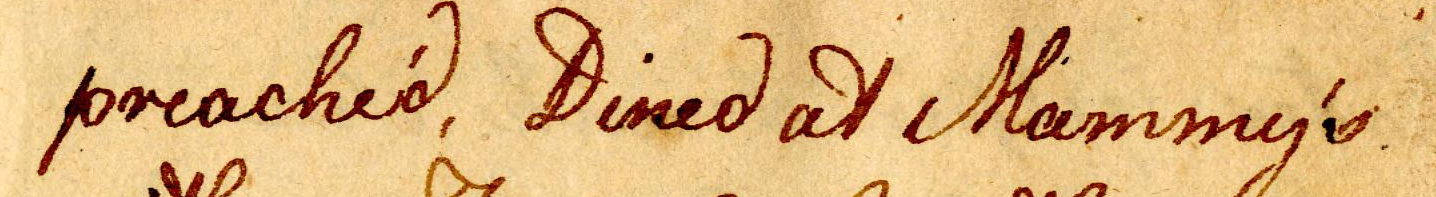preache'd, Dined at Mammy's
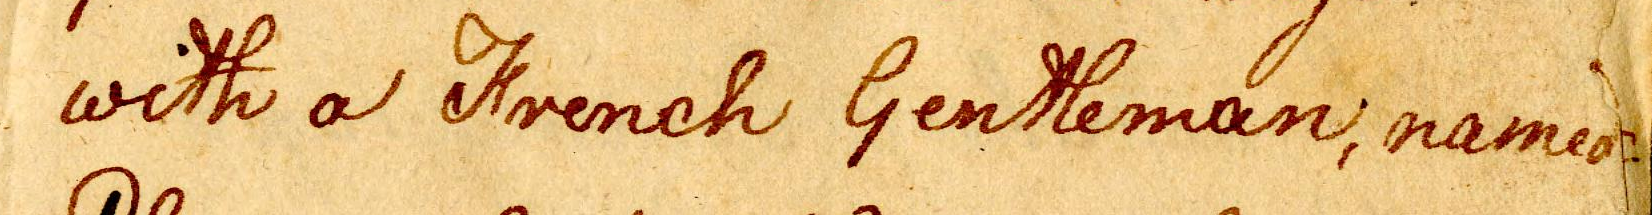with a French Gentleman, named
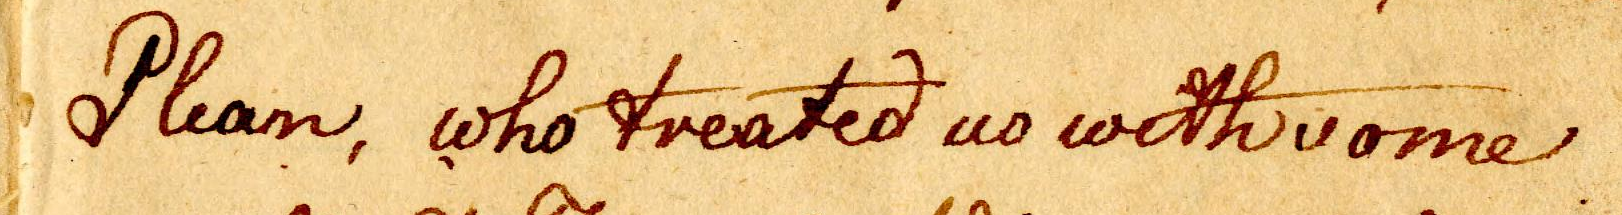Plean, who treated us with some
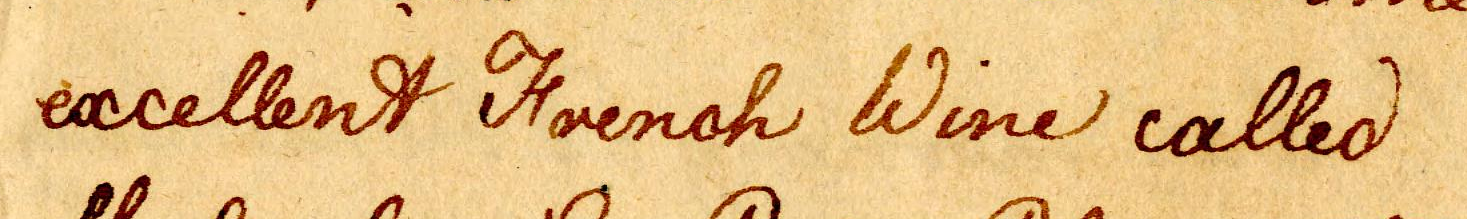excellent French Wine called
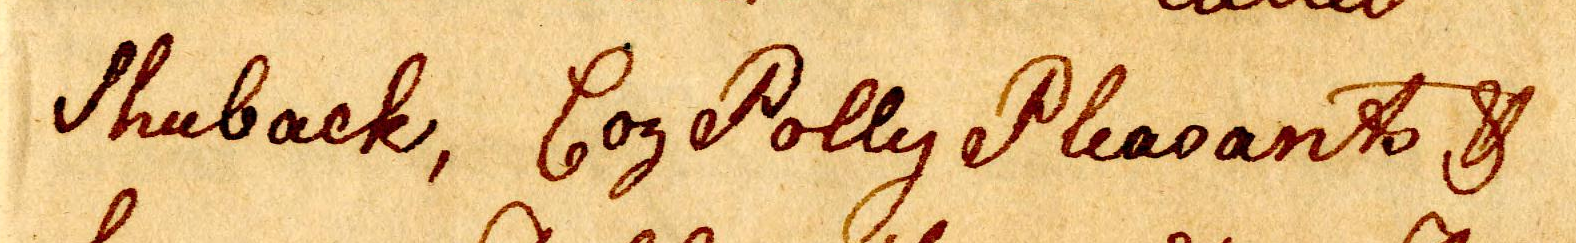Shuback, Coz Polly Pleasants &
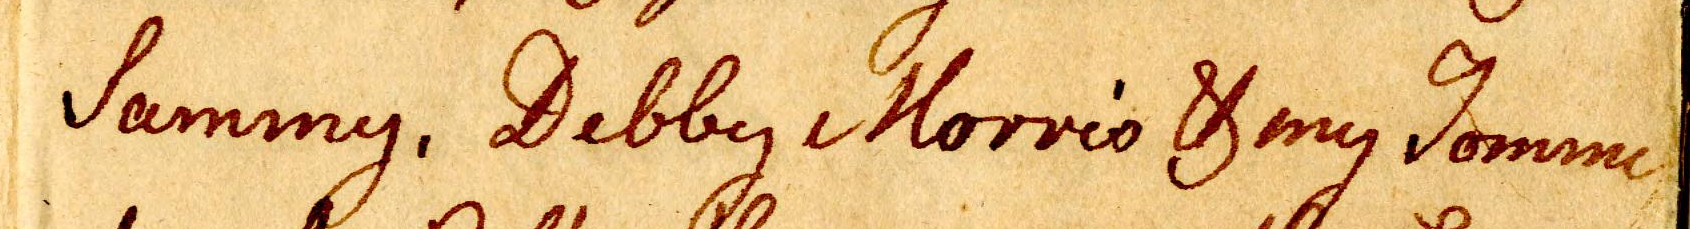Sammy, Debby Morris & my Tommy
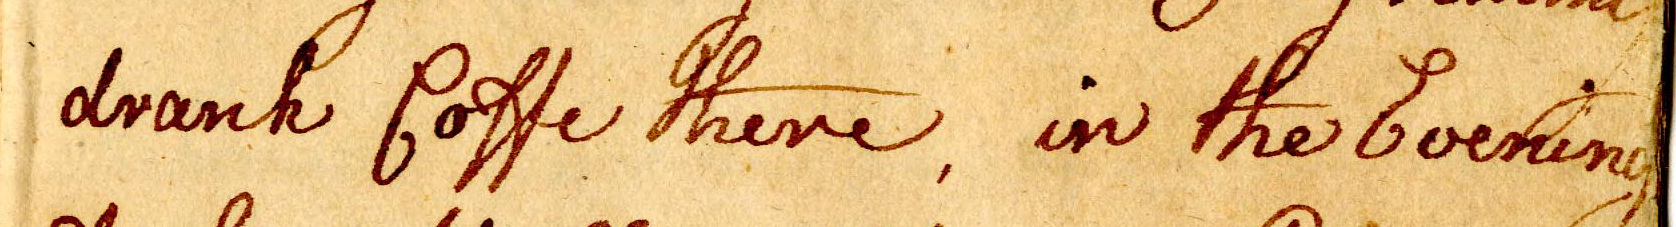drank Coffe there, in the Evening
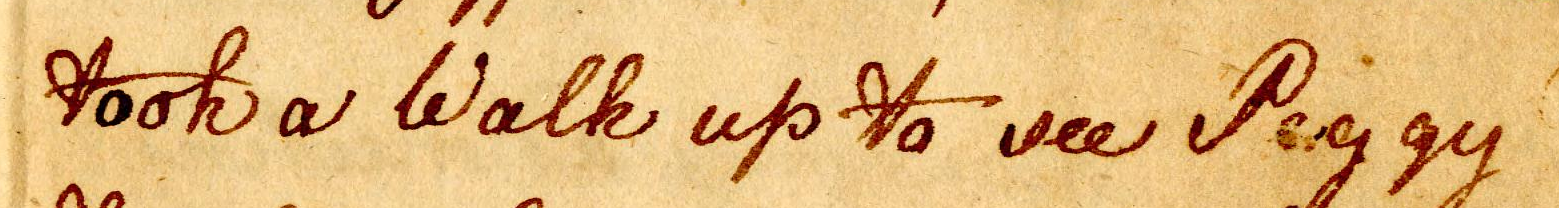took a Walk up to see Peggy
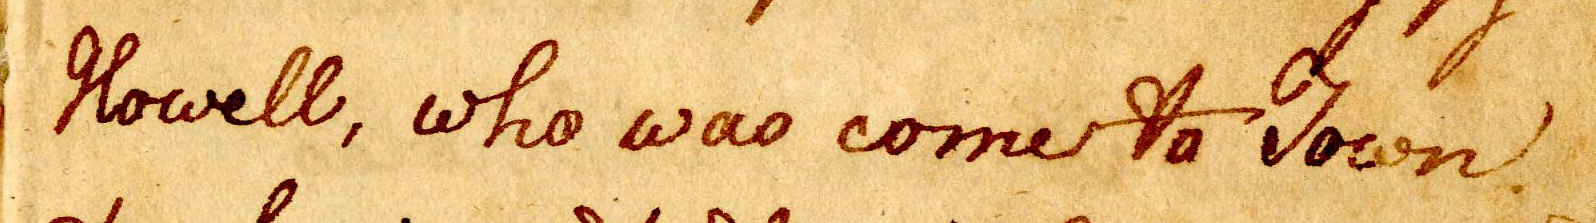Howell, who was come to Town
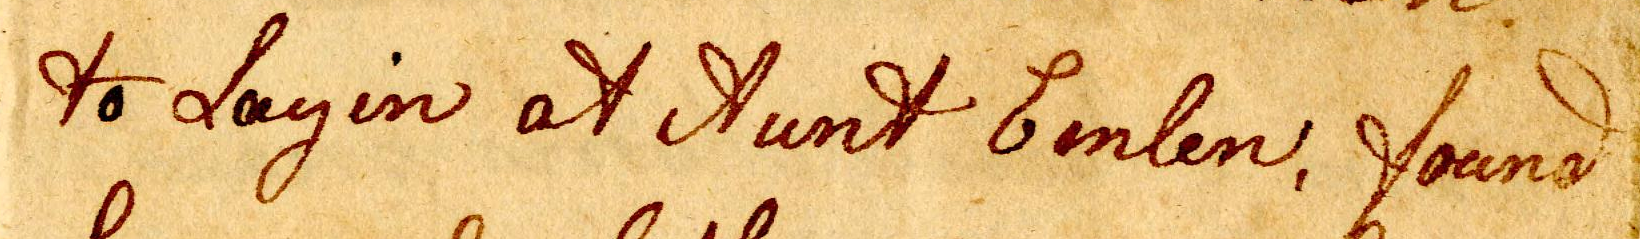to Lay in at Aunt Emlen, found
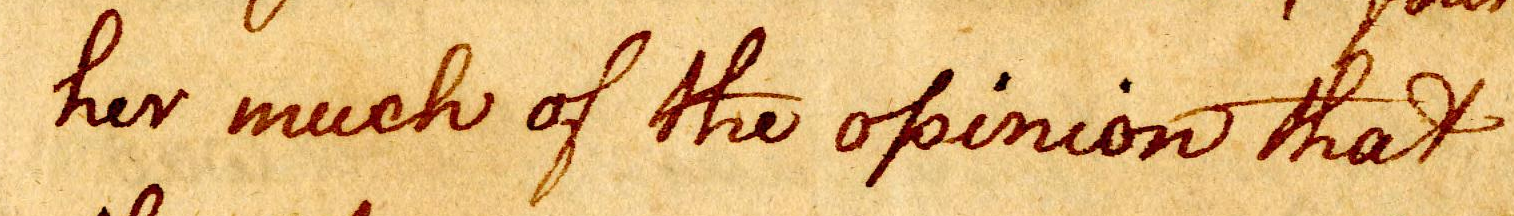her much of the opinion that
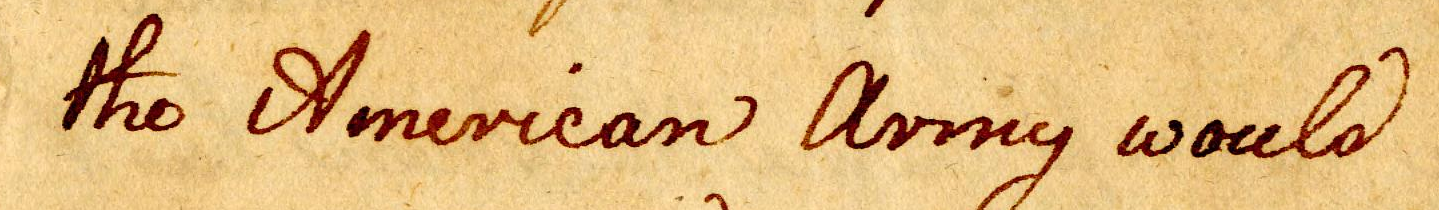the American Army would
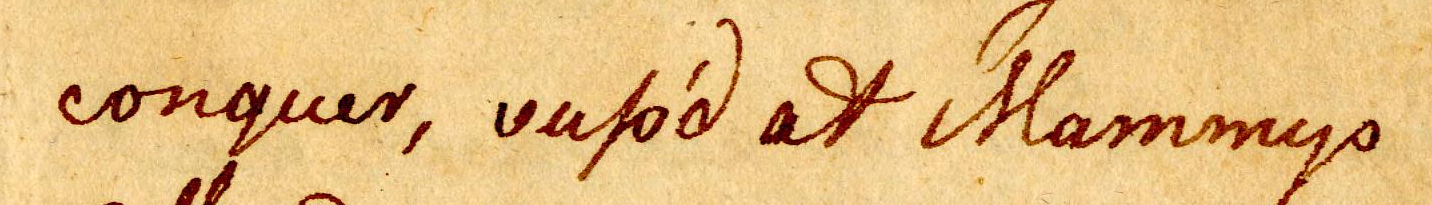conquer, sup'd at Mammys
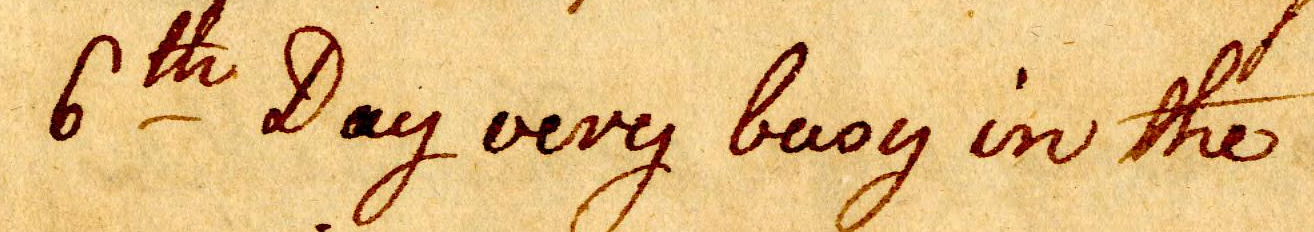6^th Day very busy in the
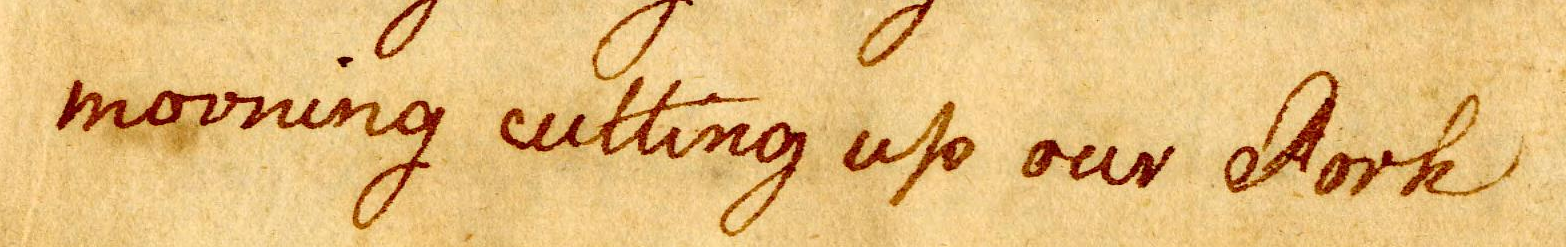morning cutting up our Pork
